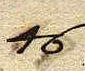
46
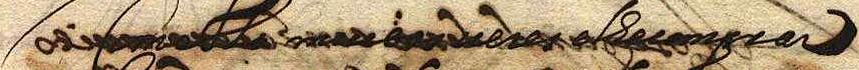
Com ella na casa e carceres e lhe comprar
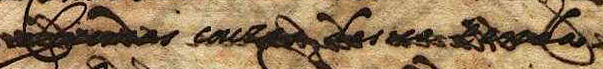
algumas couzas de sua tenda
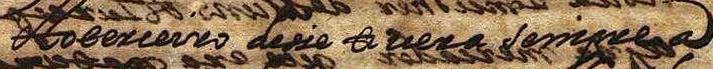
Ao terceiro disse tivera sempre a
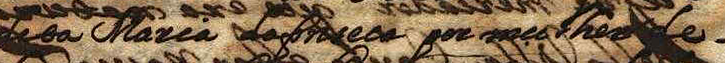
dita Maria da fonseca por mulher de
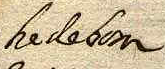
he de bom
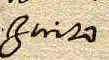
Juizo
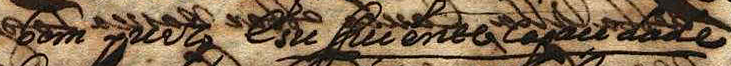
bom juizo e sufficiente capacidade
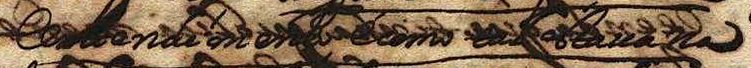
E entendimento, e como tal estaua na
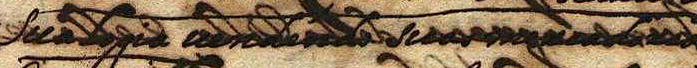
Sua logia uendendo suas mercadorias
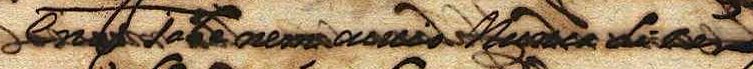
E naõ sabe nem ouuiu Nunca dizer
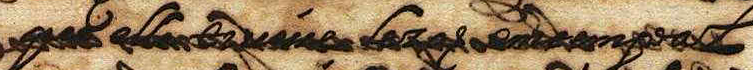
que ella tiuesse Lezaõ em tempo al
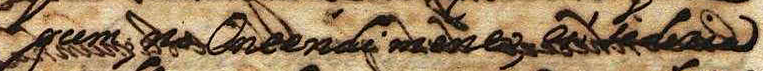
gum; no Entendimento, e se dezia
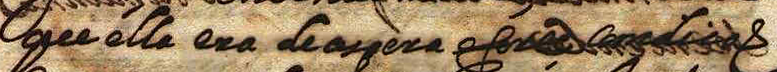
que ella era de aspera e forte comdiçaõ
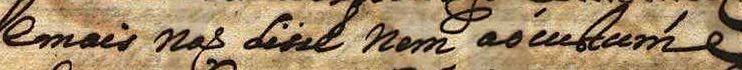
E mais naõ disse nem ao custume
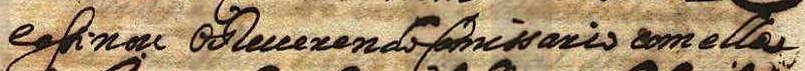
e assinou o Reuerendo Comissario com ella
